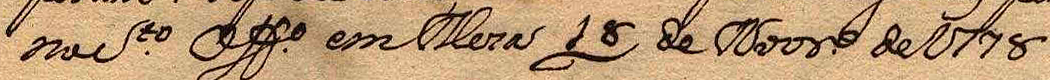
no S.to Off.o em Meza 18 de Novr.o de 1778
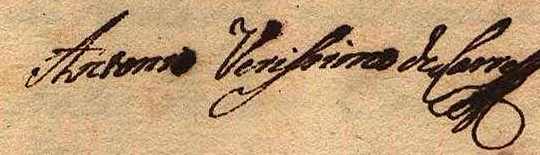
Antonio Verissimo de Larre
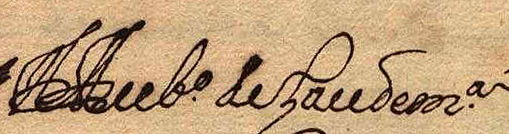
Arceb.o de Lacedem.ar
